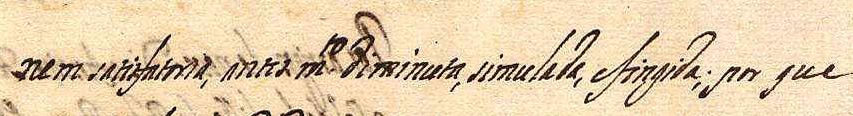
nem satifatoria, antes m.to diminuta, simulada, e fingida; por que
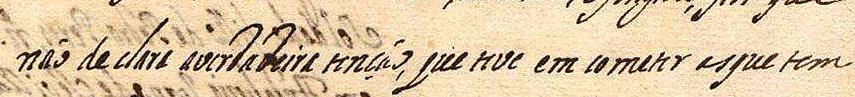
naõ declara a verdadeira tençaõ, que teve em cometer as que tem
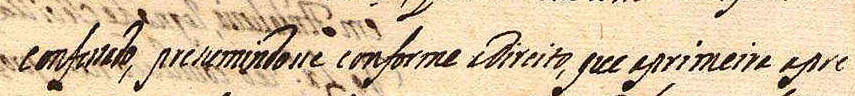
confessado, presumendosse conforme o direito, que a primeira apre
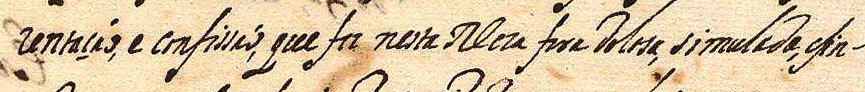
zentaçaõ, e confissaõ, que fez nesta Meza fora dolosa, simulada, e fin
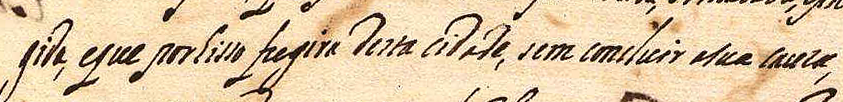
gida, e que por hisso fugira desta cidade, sem concluir a sua cauza,
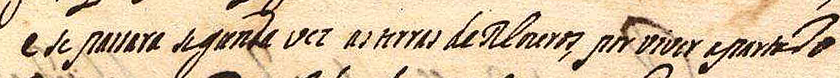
e se passara segunda vez as terras de Mouros, por viver apartado
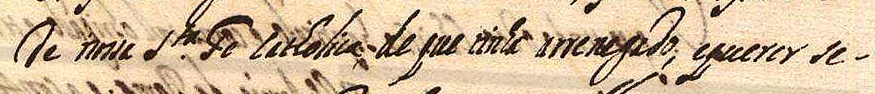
de nossa s.ta Fe catholica, de que tinha arrenegado, e querer se
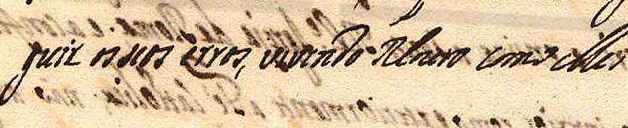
guir os seos erros, vivendo Mouro como elles
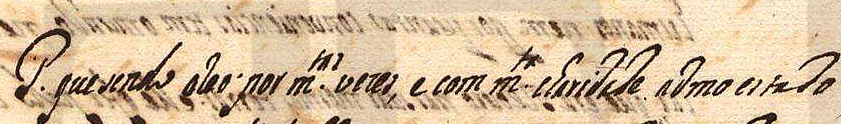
P. que sendo o Reo por m.tas vezes, e com m.ta charidade admoestado
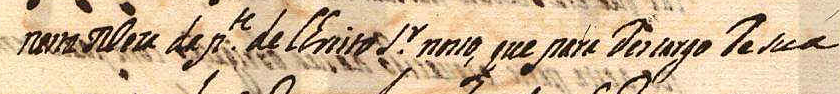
nesta Meza da p.te de Christo s.r nosso, que para descargo de sua
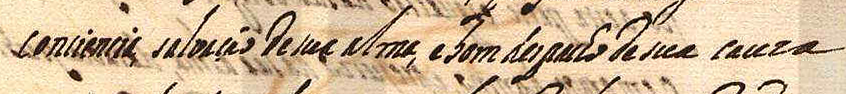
conciencia, salvaçaõ de sua alma, e bom despacho de sua cauza
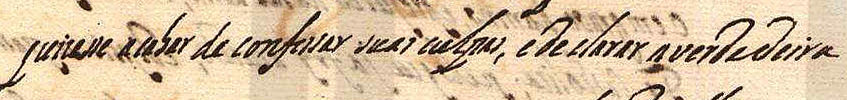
quizesse acabar de confessar suas culpas, e declarar a verdadeira
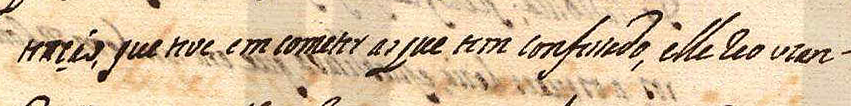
tenção, que teve em cometer as que tem confessado, elle Reo vzan
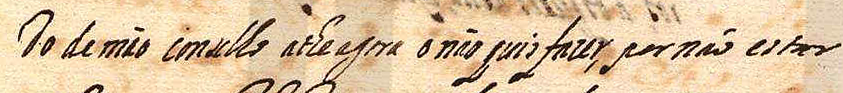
do de máo conselho athe agora o não quis fazer, por naõ estar
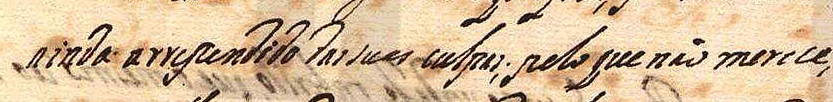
ainda arrependido das suas culpas; pelo que naõ merece,
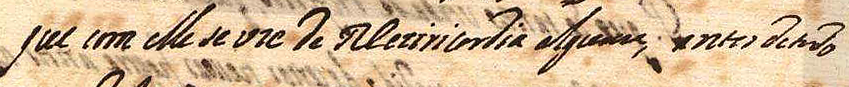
que com elle se uze de Meziricordia alguma, antes de todo
